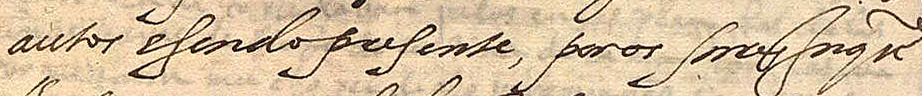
autos E sendo presente, por os snres̄ Jnqures
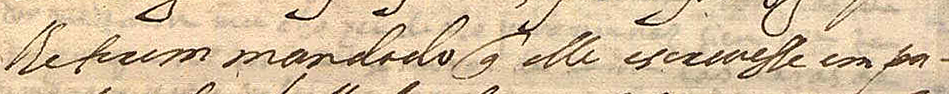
lhe terem mandado q̄ elle escreuesse em pa
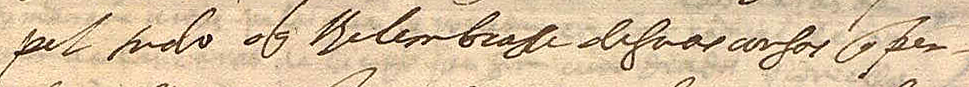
pel tudo o q̄ lhe lembrasse de suas cousas q̄ per
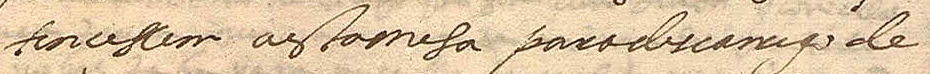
tencessem a esta mesa para descarrego de
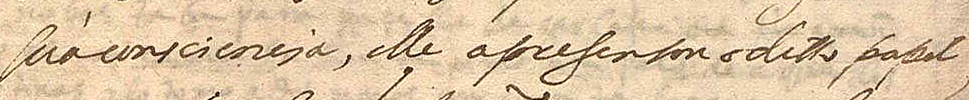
sua consciencia, elle apresentou o ditto papel
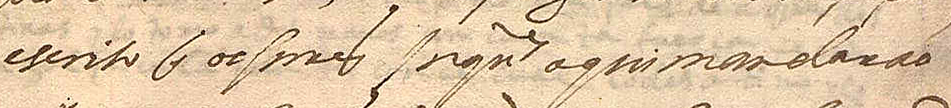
escrito q̄ os snres̄ Jnqures aqui mandaraõ
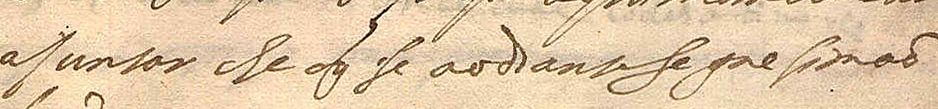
ajuntar e he o q̄ se ao diante segue simaõ
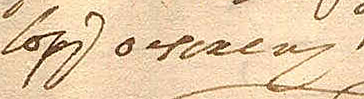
lopz̄ o escreuj
